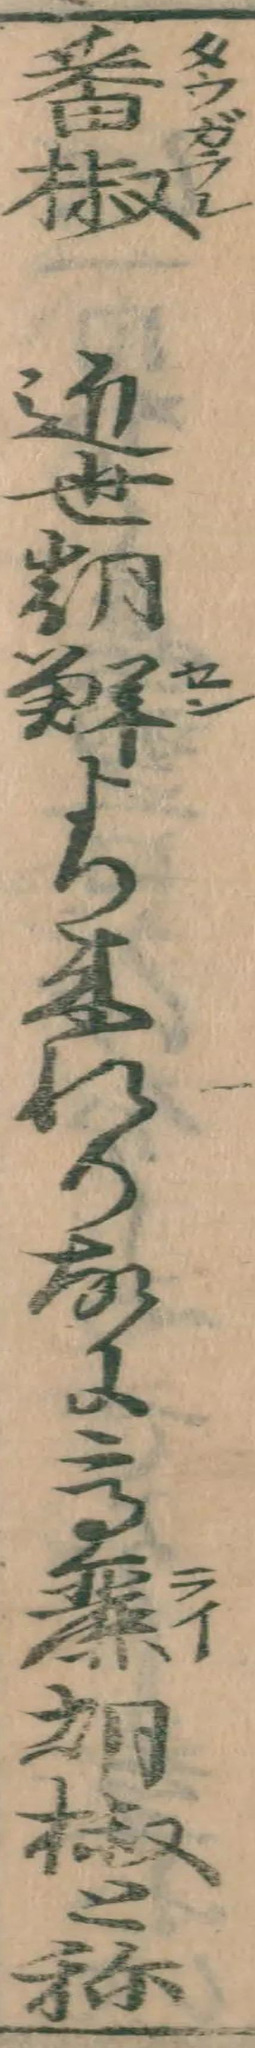番椒近世朝鮮より来れり故に高麗胡椒と称
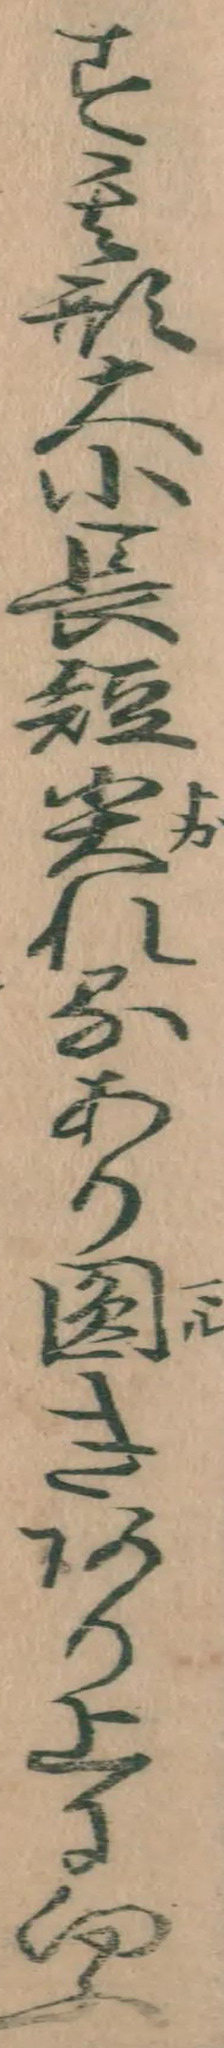す其形代大小長短尖れるあり円きあり上に向ふ
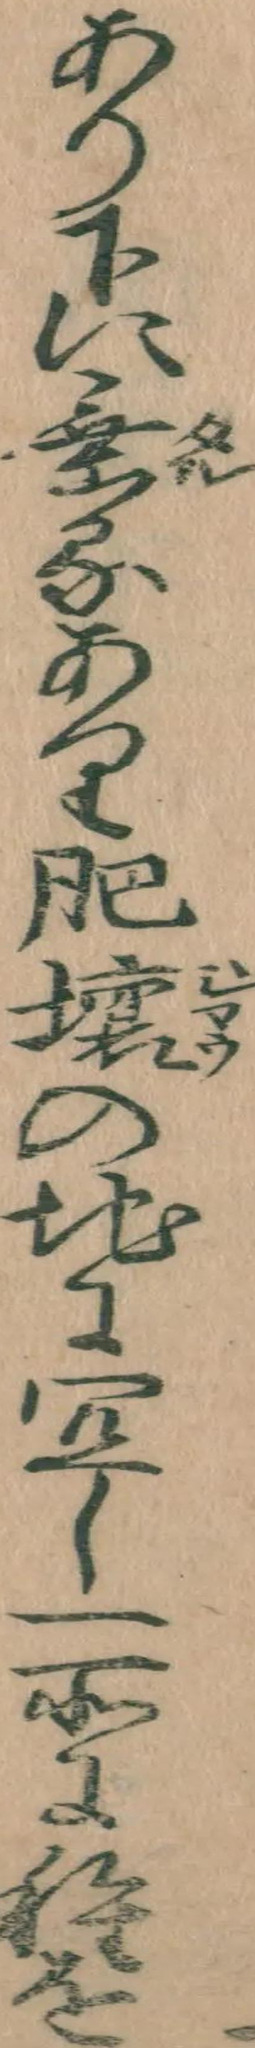ありしたに垂るあり肥壌の地に宜し一所に種を
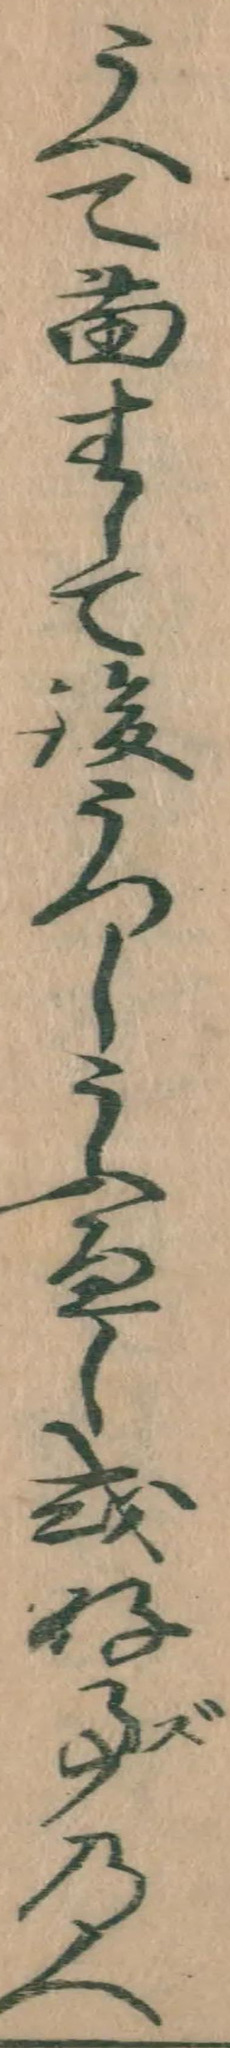うへて苗生して後うつしうふへし或好事の人
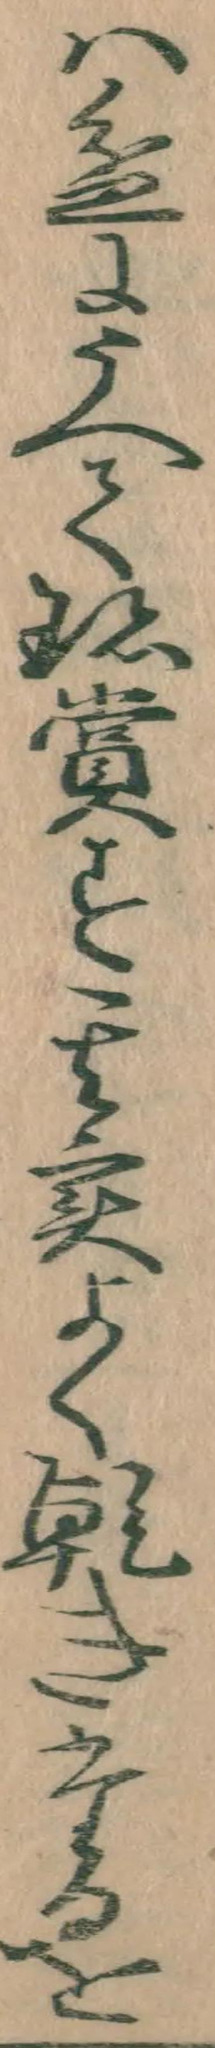は盆にうへて鑑賞す其実よく乾きたるを
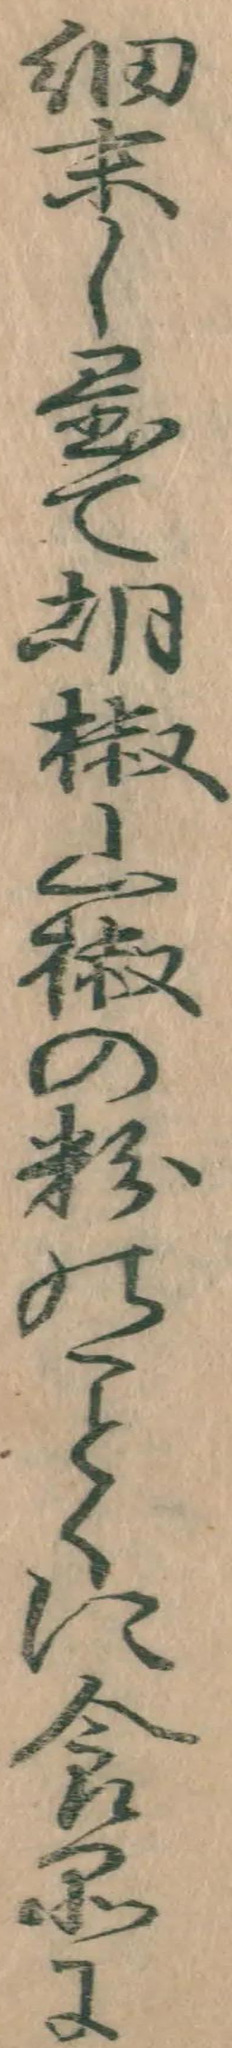細末し置て胡椒山椒の粉のことくに食品に
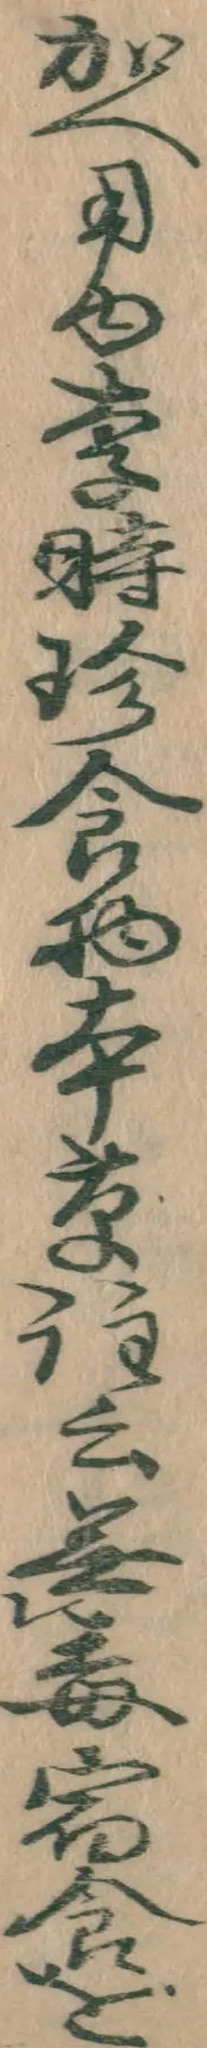加へ用ゆ李時珍食物本草註言無毒宿食を
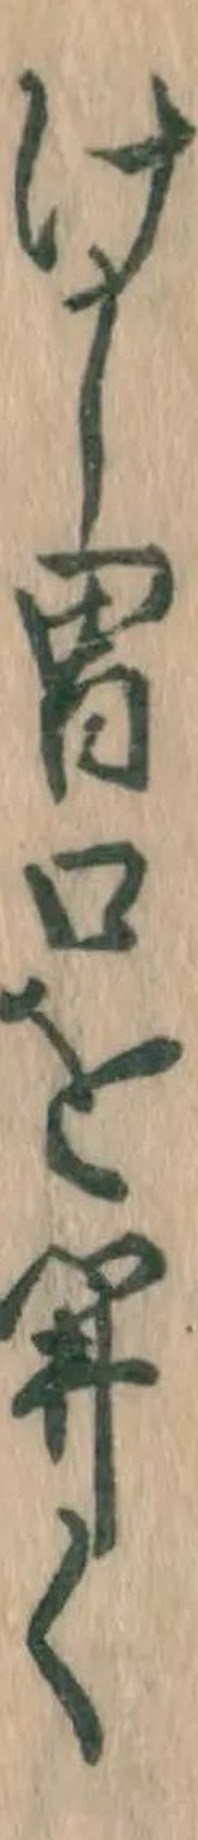けし胃口を開く

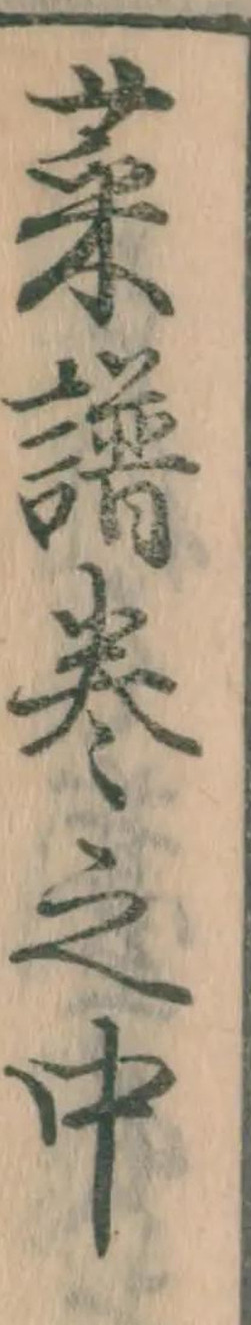菜譜巻之中
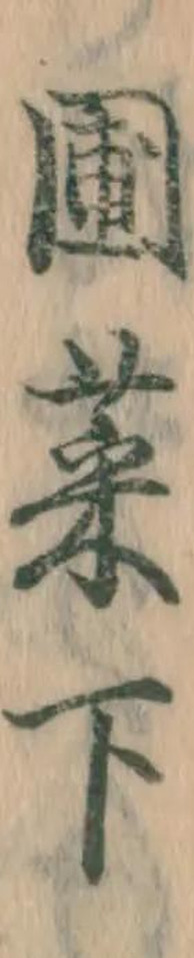圃菜下
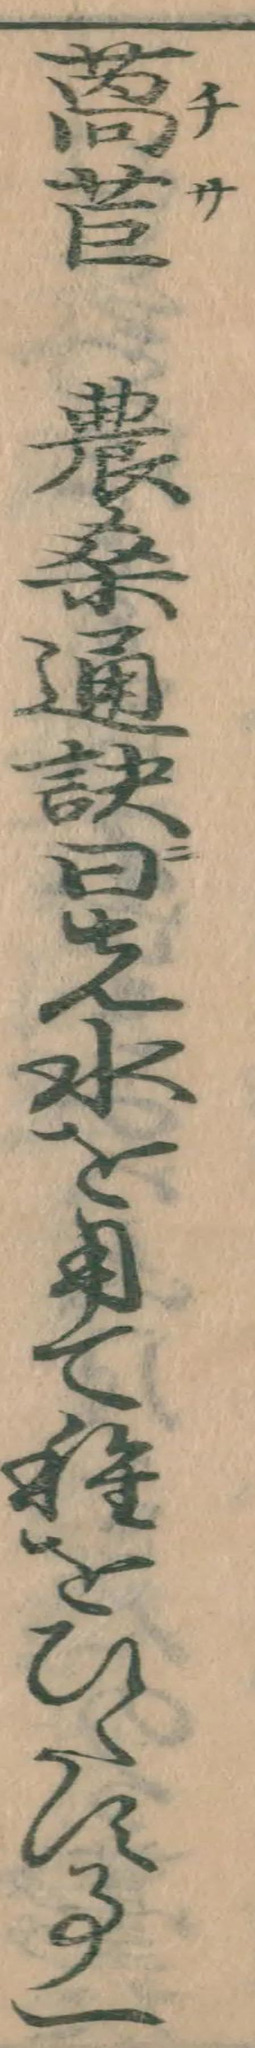萵苣農桑通訳曰先水を用て種をひたす事一
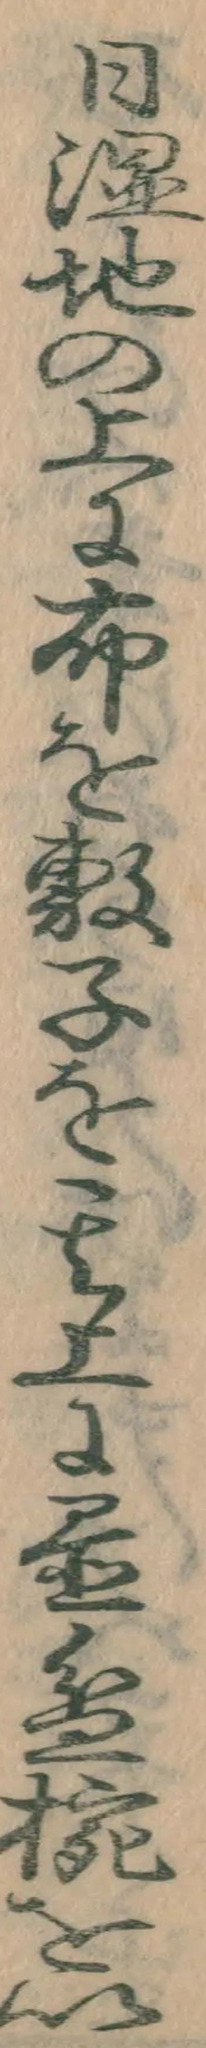日湿地の上に布を敷子を其上に置盆椀を以
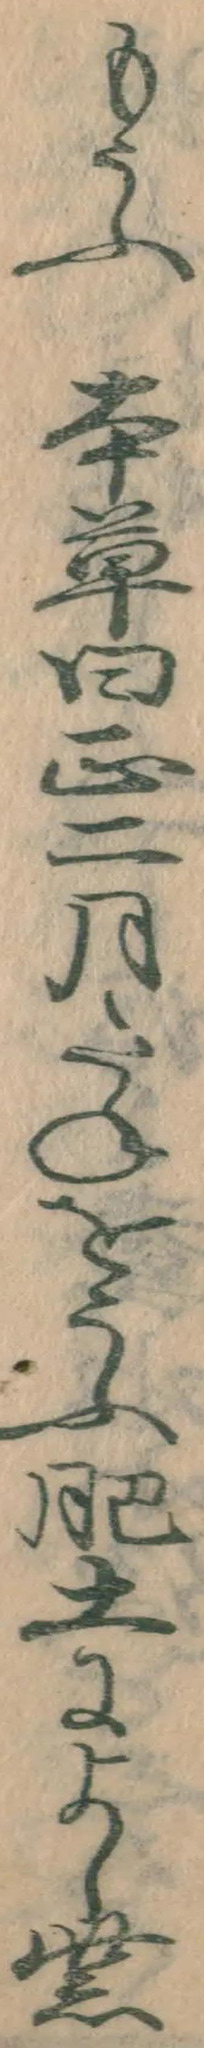もうふ本草曰正二月たねをうふ肥土によし紫
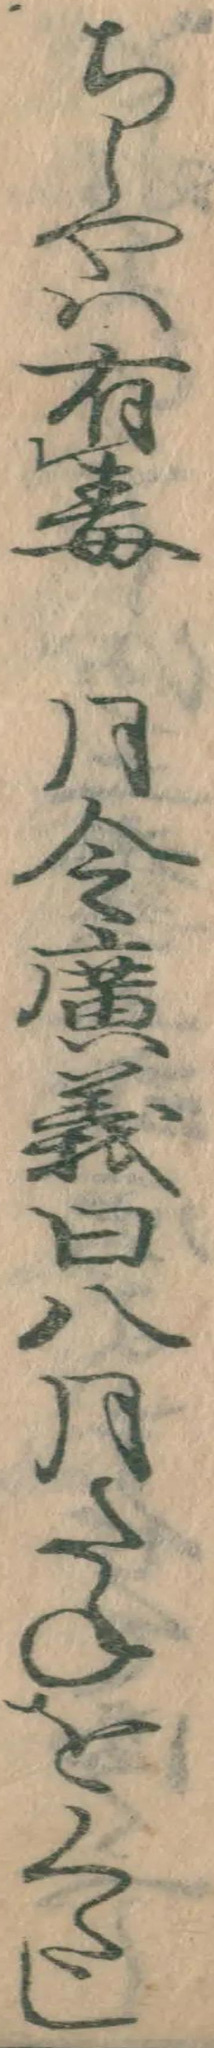ちしやは有毒月令広義曰八月たねをくたし
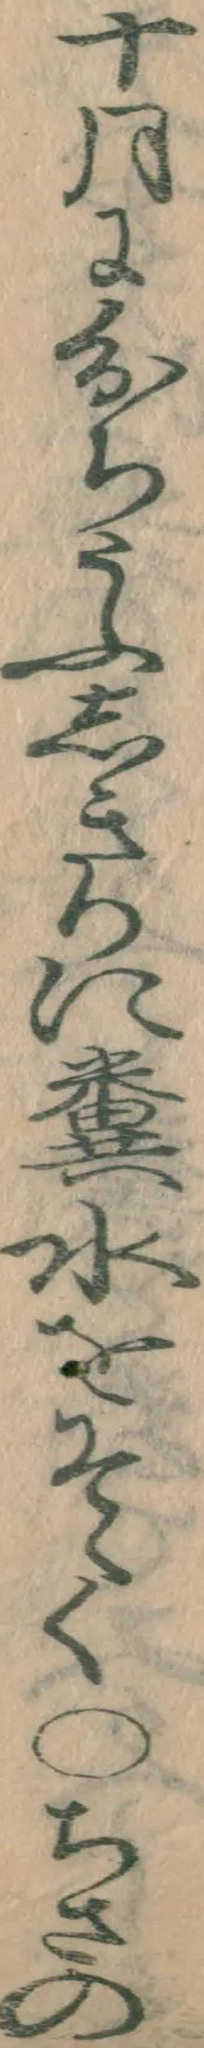十月に分ちうふしきりに糞水をそゝく〇ちさの
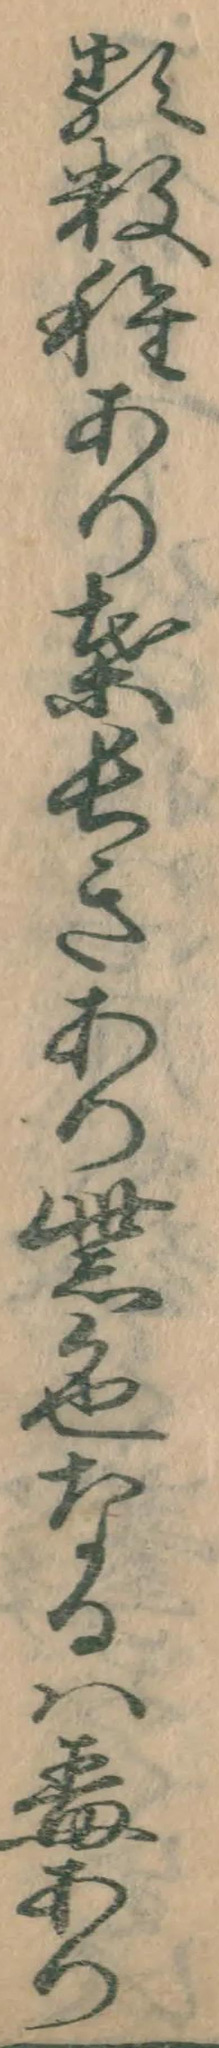類数種あり葉長きあり紫色なるは毒あり
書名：菜譜 3巻
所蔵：国立国会図書館 National Diet Library, JAPAN
